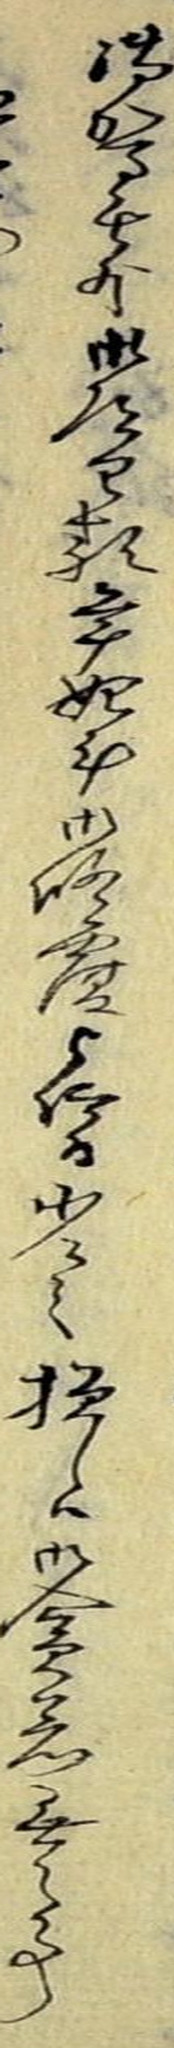一御駕其外御道具類年始斗御修覆被仰付少々之損しは御貧着無之事
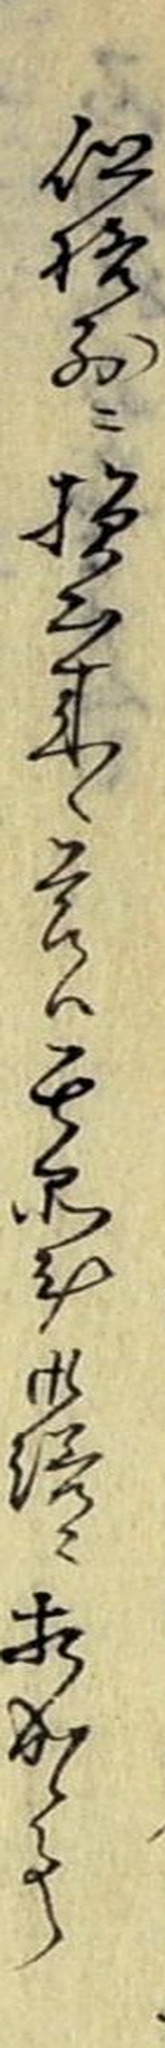但格別に損出来候節は其品斗御繕に相成候事
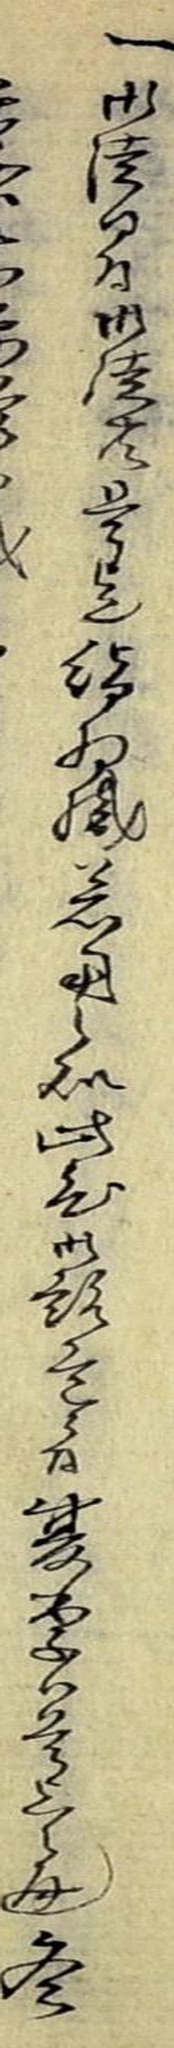一御徒目付御徒共是迄絹羽織着用之処此度御趣意に付夏季は是迄之通冬
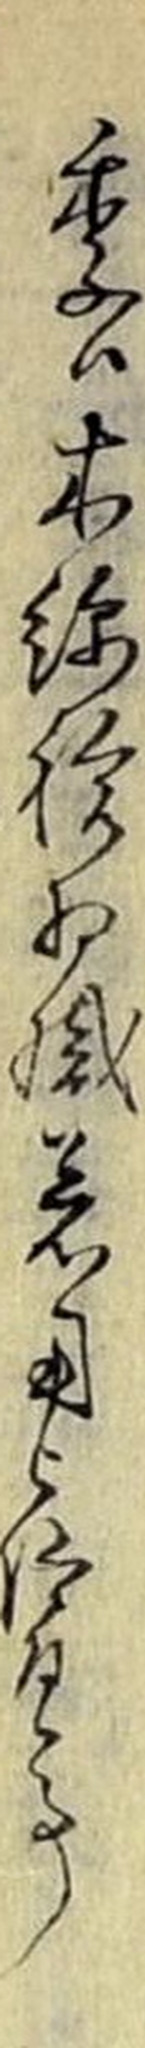季は木綿袷羽織着用被仰付候事
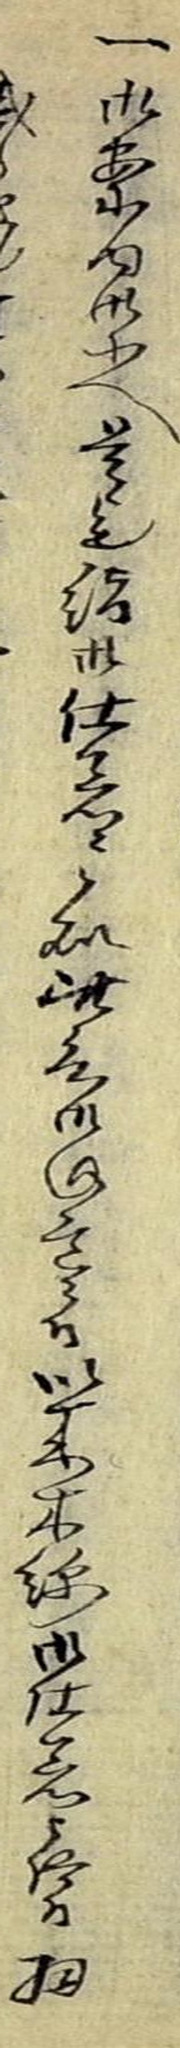一御案内御小人是迄絹御仕着に候処此度御趣意に付以來木綿御仕着被仰付羽
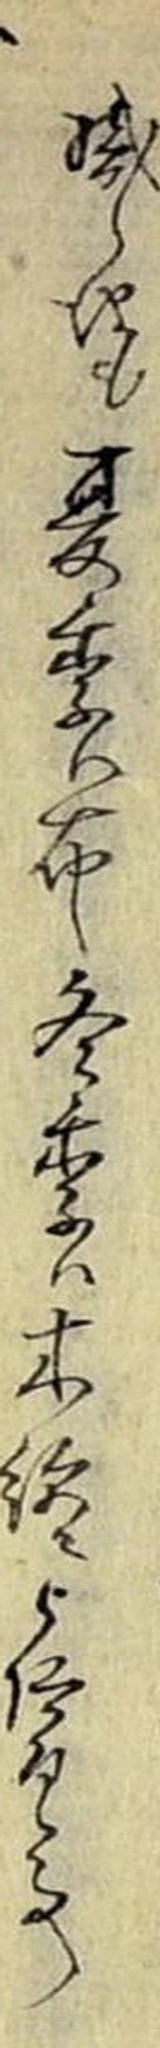織之儀も夏季は布冬季は木綿に被仰付候事
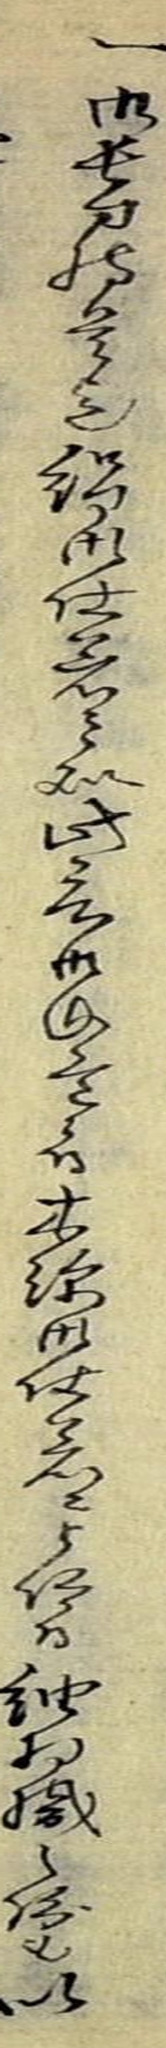一御長刀持是迄絹御仕着に候処此度御趣意に付木綿御仕着に被仰付紬羽織之儀も以
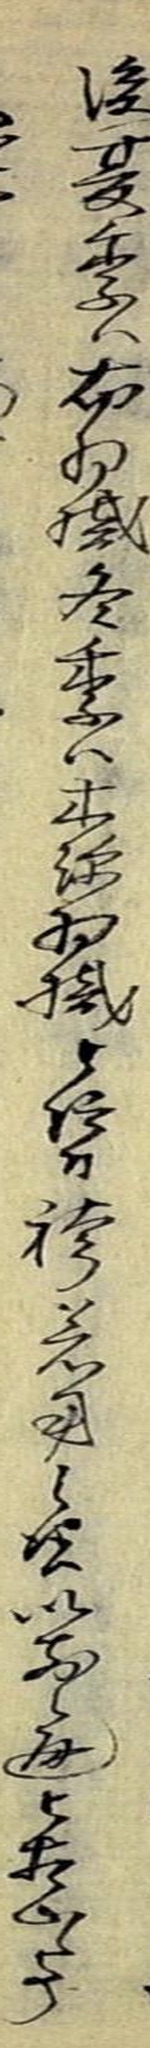後夏季は布羽織冬季は木綿羽織被仰付袴着用之儀は以前之通被相止候事
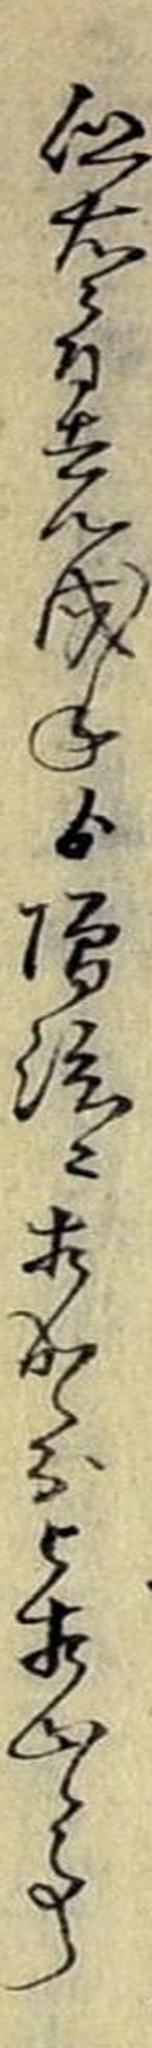但右に付去ル戌年ゟ増渡に相成候分被相止候事
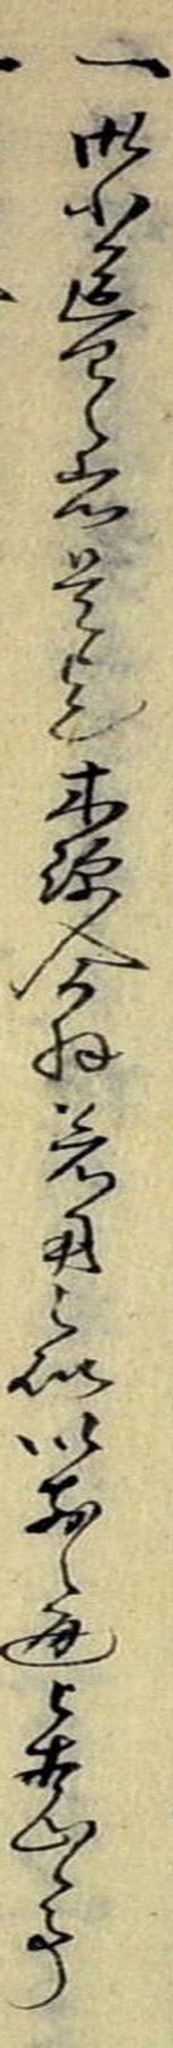一御小道具之者是迄木綿合羽着用之処以前之通被相止候事
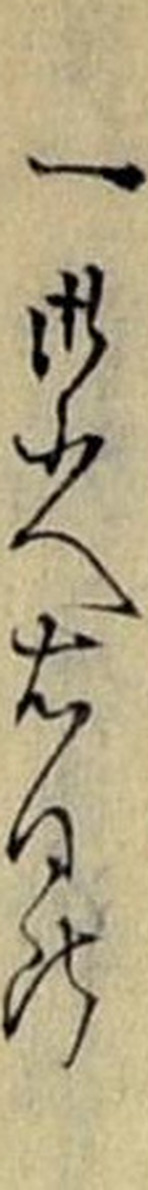一御小人右同断
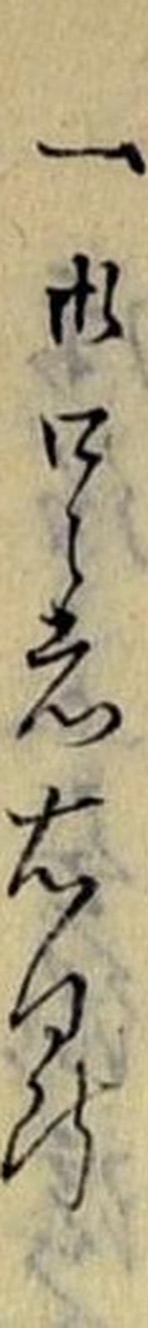一御口之者右同断
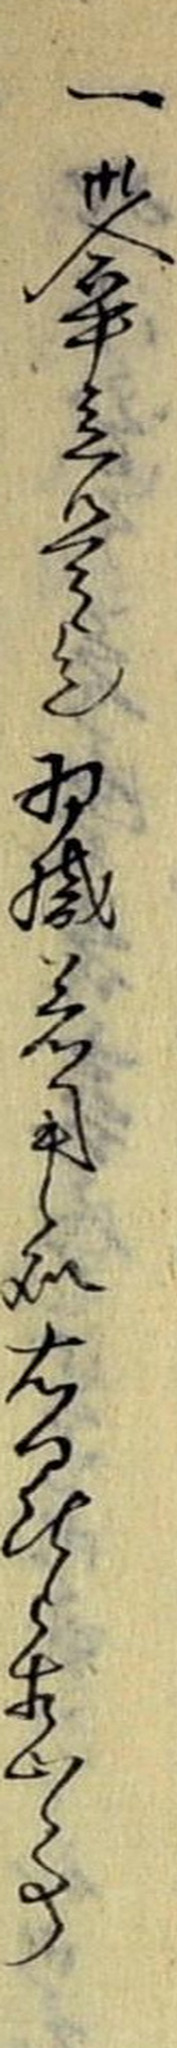一御傘立是迄羽織着用之処右同断被相止候事
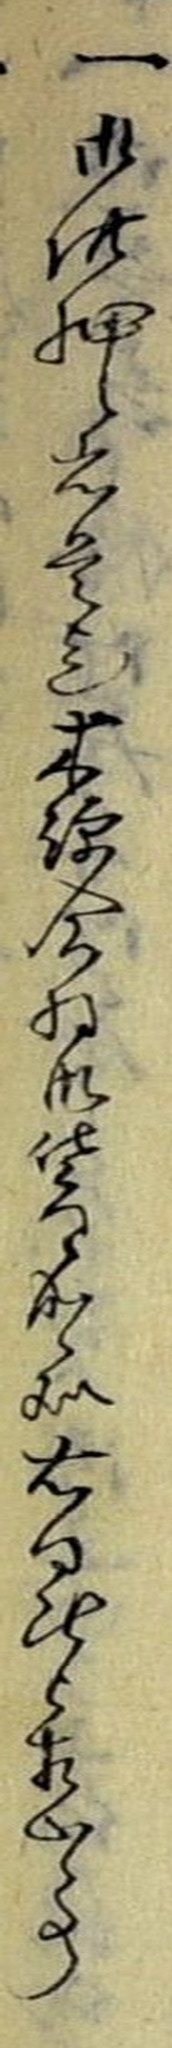一御供押之者是迄木綿合羽御貸被成候処右同断被相止候事
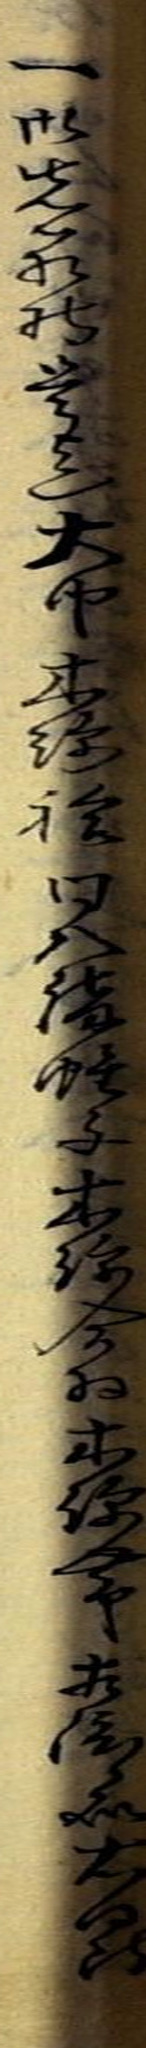一御先箱持是迄大巾木綿袷同八講帷子木綿合羽木綿帯相渡候処右同断
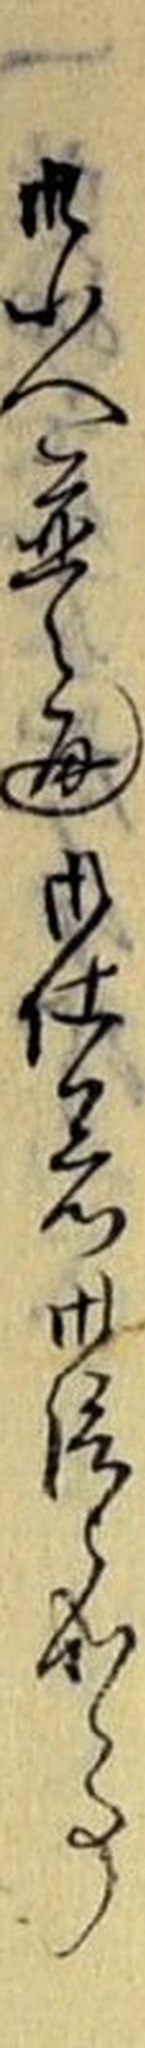御小人並之通御仕着御渡被成候事
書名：命令之部 六
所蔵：福井県文書館 Fukui Prefectural Archives
